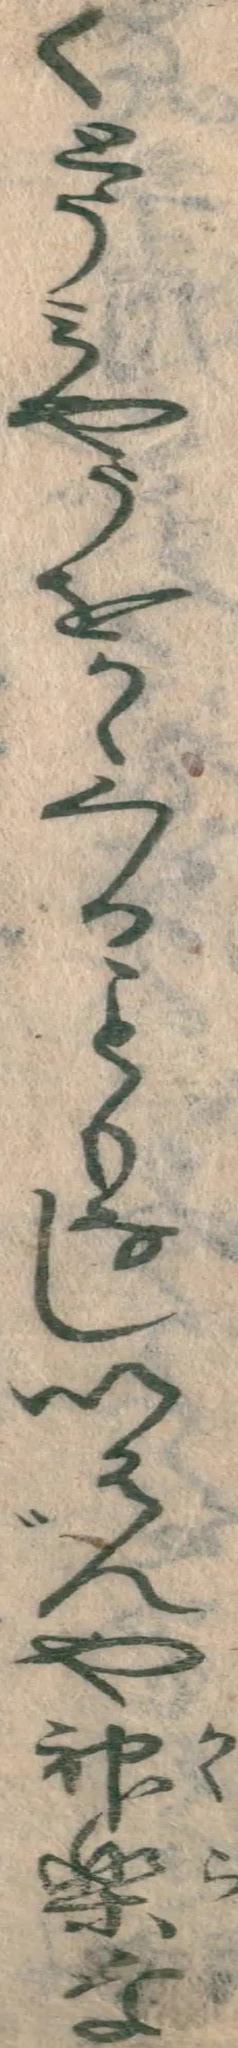くとうみやうをかゝくることもなしいはんや神楽な
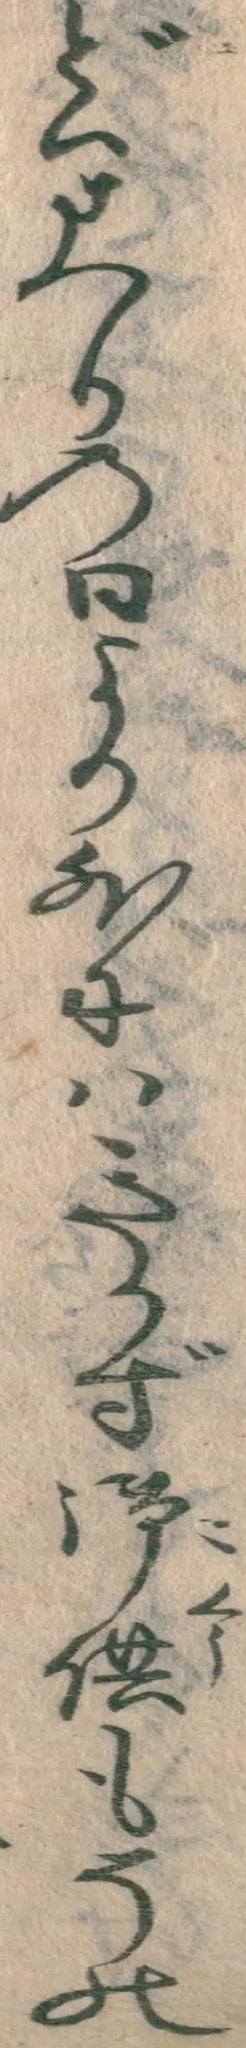どはまつりの日より外にはきかず御供もその
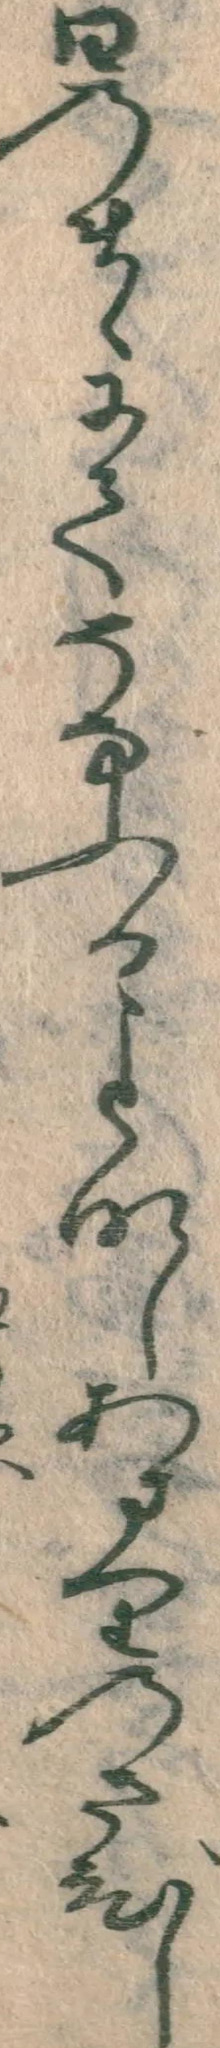日のまゝにてそなふることなしあまりのさびし
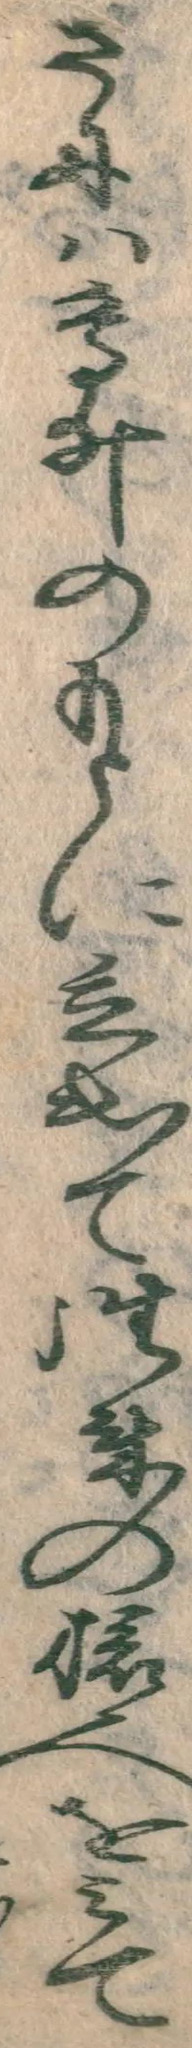さには鳥井のもとに立きて往来の様人をみて
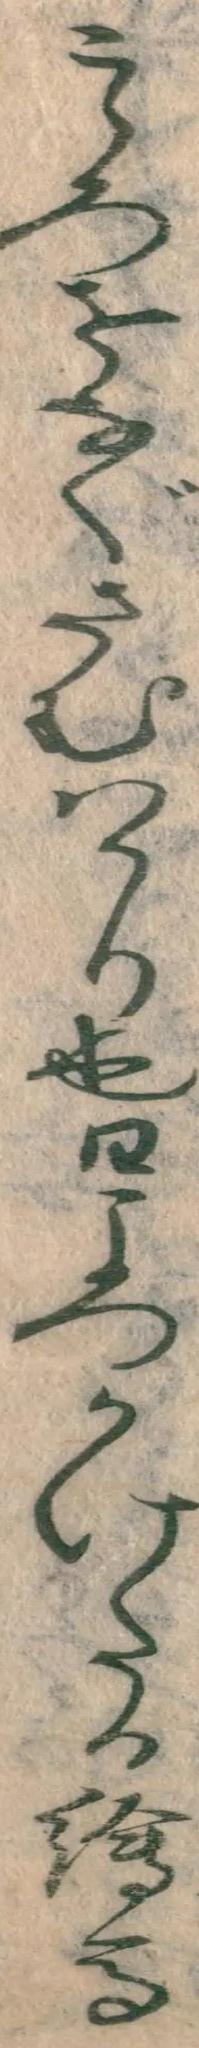こゝろをなぐさむばかり也日ころかけたる絵馬
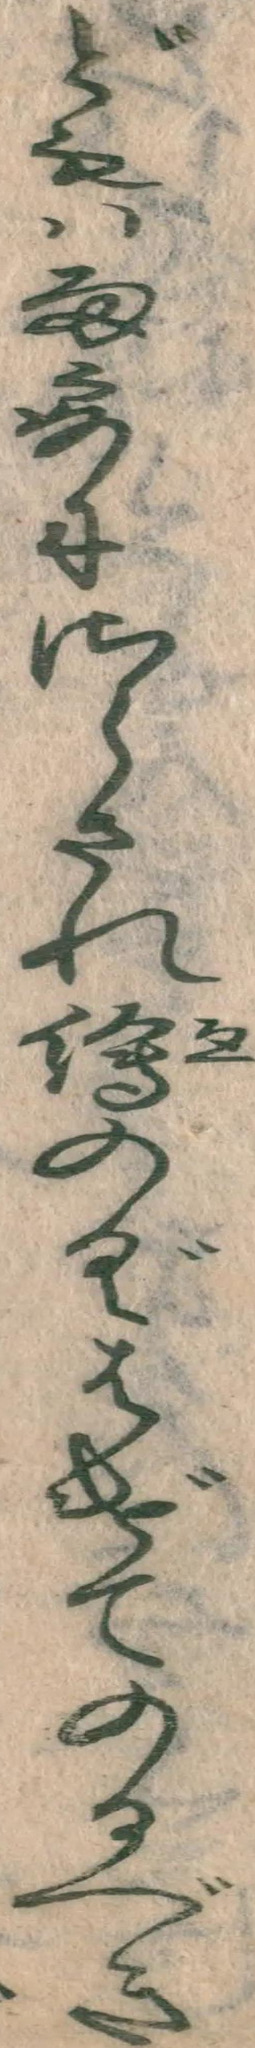どもは雨露にさらされ絵のぐはげてのるべき
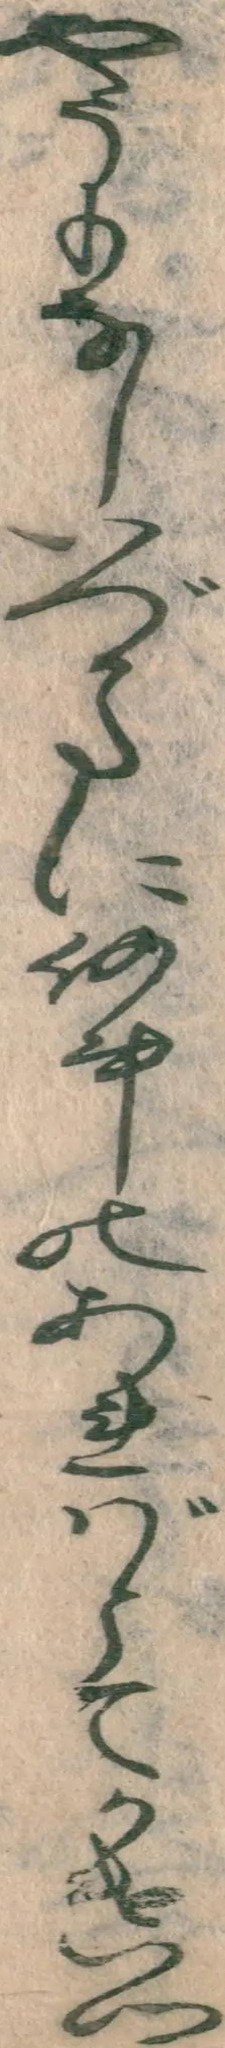やうもなしいづかたに何事のあればとてかけいづ
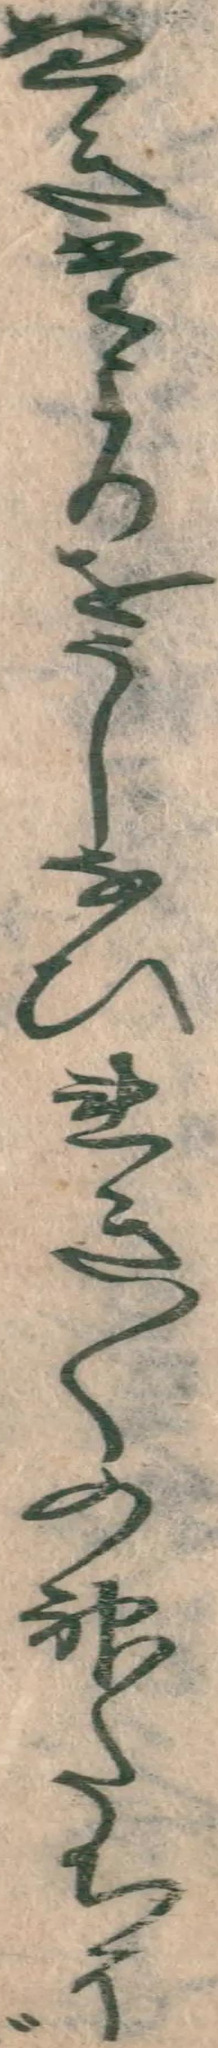へきたよりをうしなひれき〳〵の神たちに
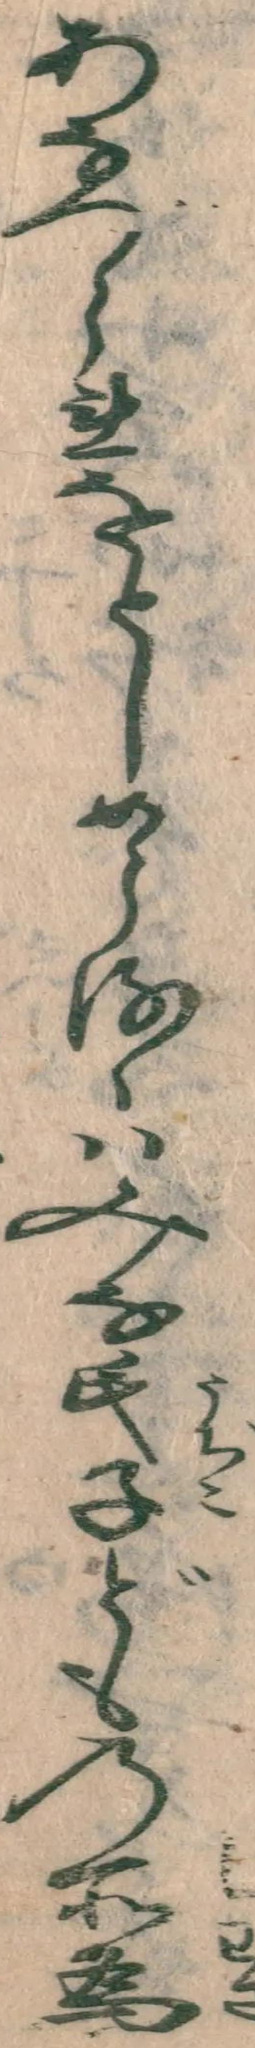あなづられをとしめらるゝはみな氏子どもの所為
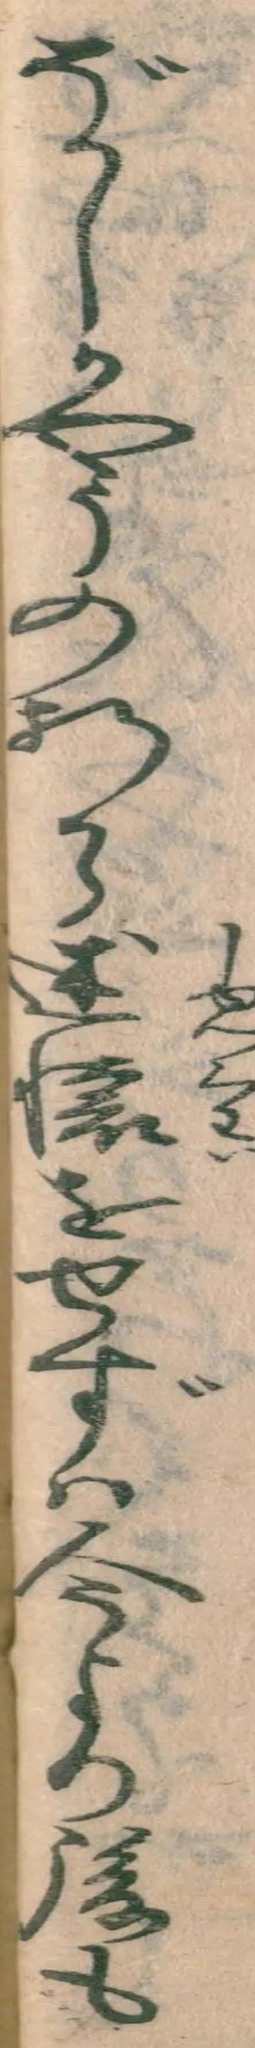ぞかしかやうの折から述懐をせずは今より後も
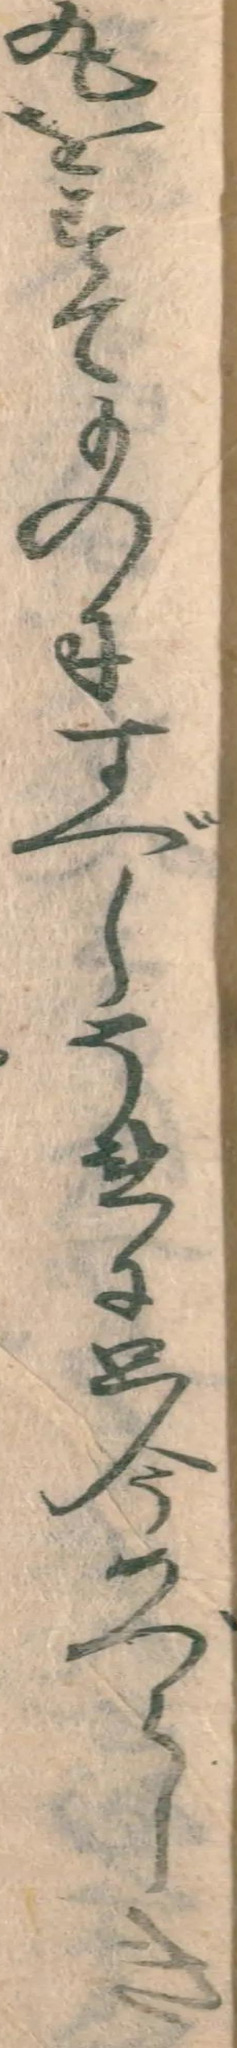丸をすてものにすべしそれに只今めづらしき
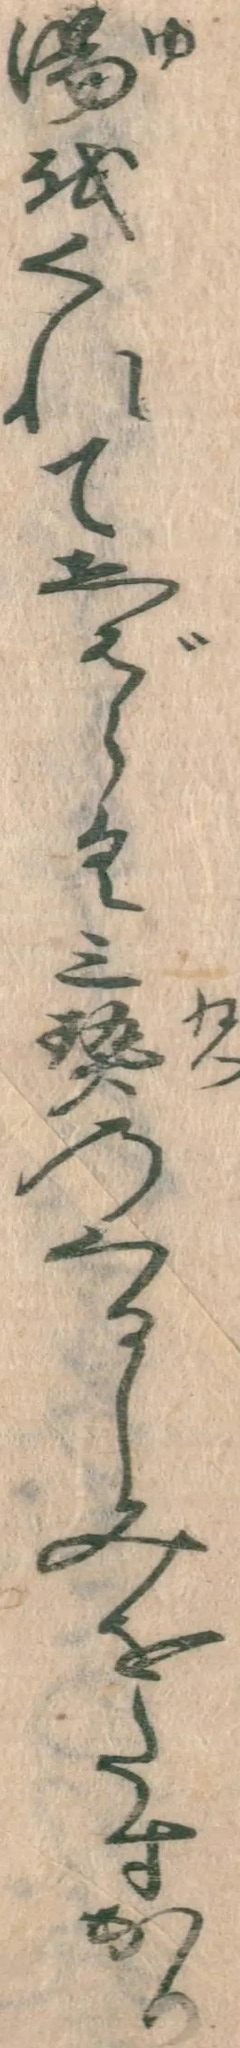湯をくれてしばらく三熱のくるしみをたすかり
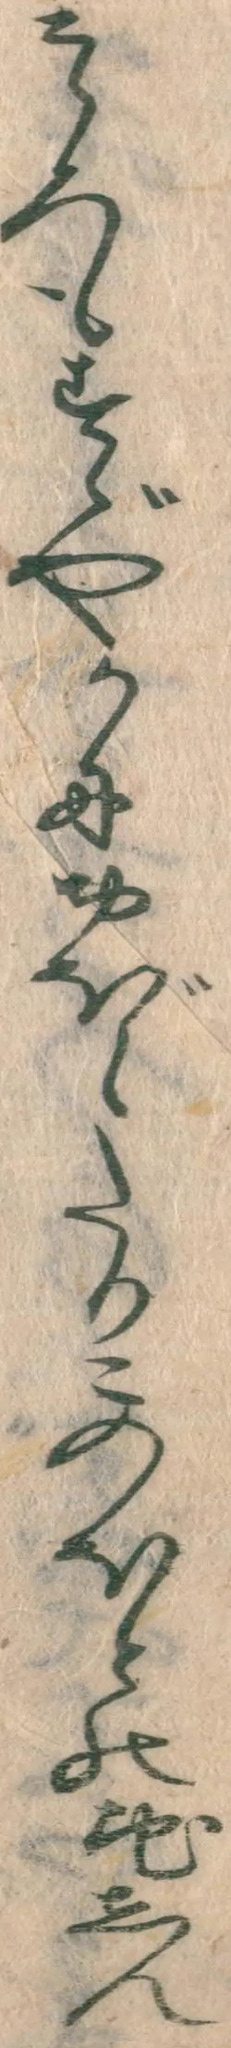こゝろもすゞやかにおぼしたりこのほとの地しん
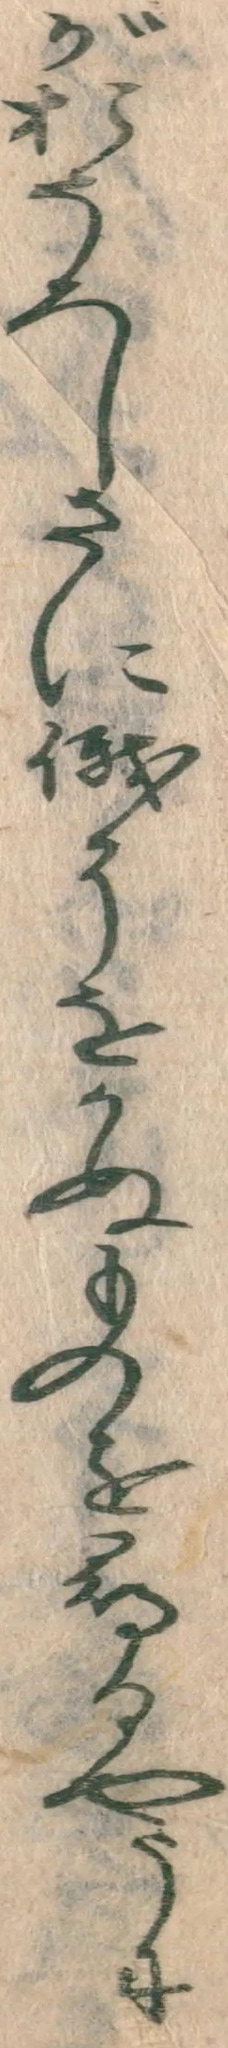がおそろしさに俄にをかぬものを着るやうに
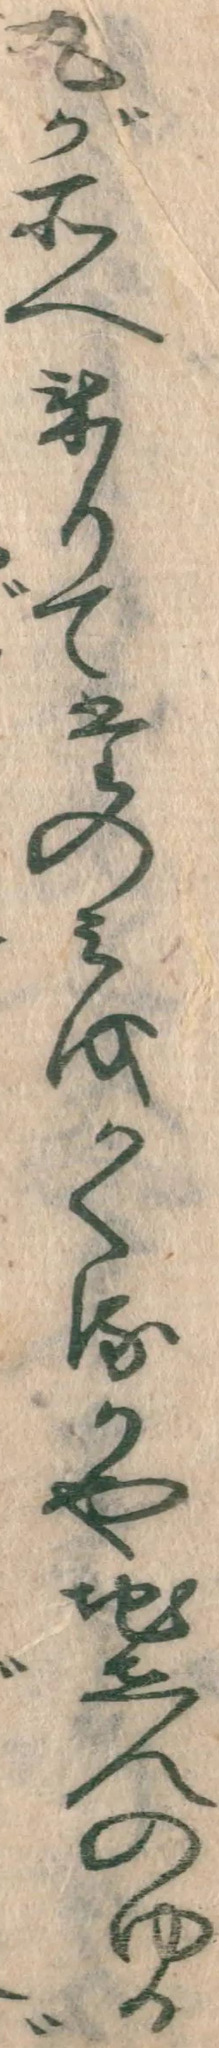丸が所へ来りてたのみをかくるかや地しんのゆる
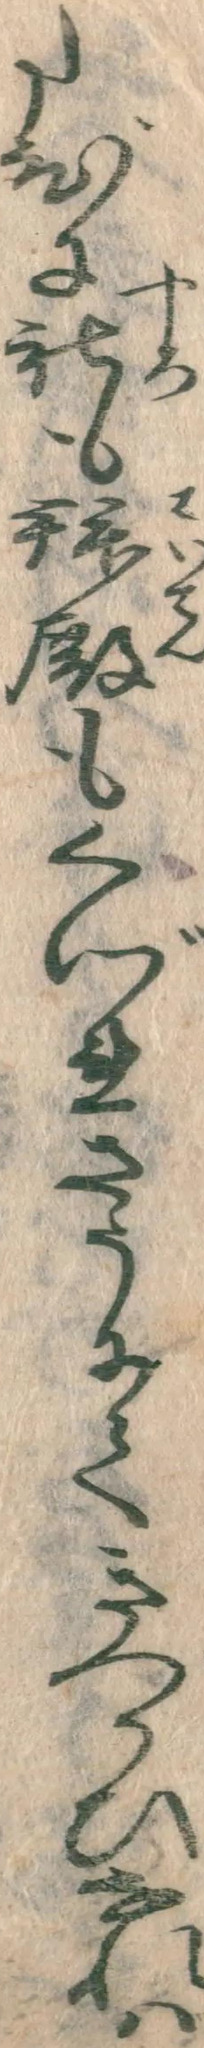たひに社も拝殿もくづれさうにてきづかひなれば
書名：艱難目異志. 上,下
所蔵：国立国会図書館 National Diet Library, JAPAN
